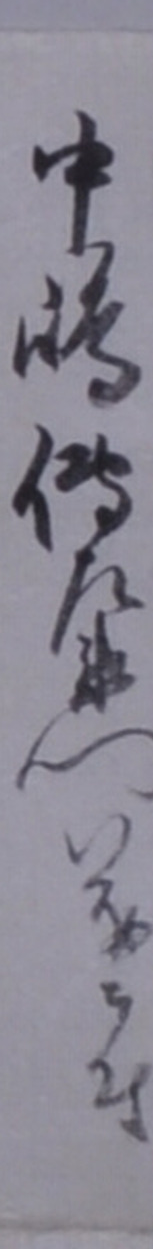中嶋伝左衛門義ニ付
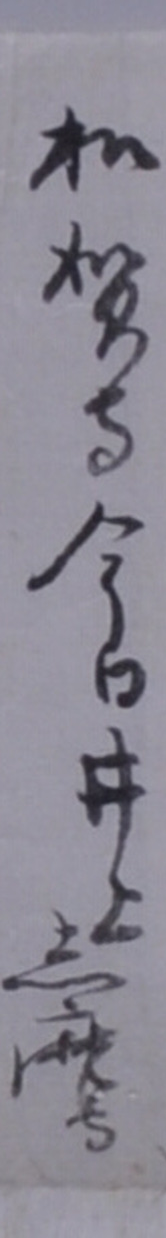加賀守今日井上志摩守
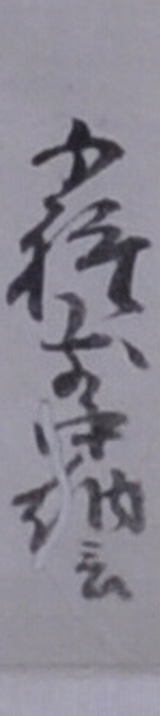千種前中納言
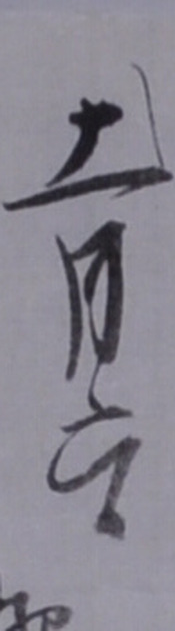十一月六日
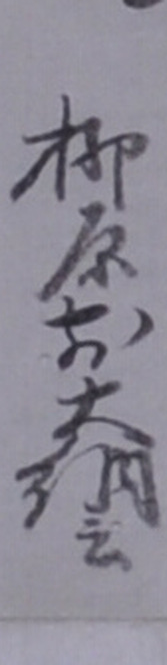柳原前大納言
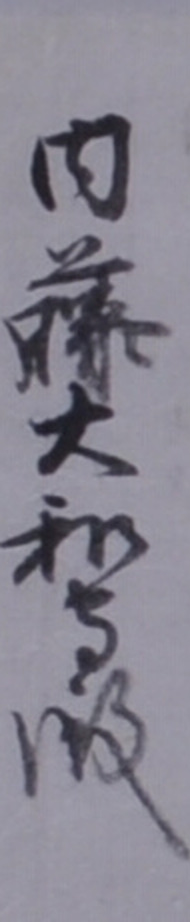内藤大和守殿
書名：書状
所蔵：伊那市立高遠町図書館・合同会社AMANE
